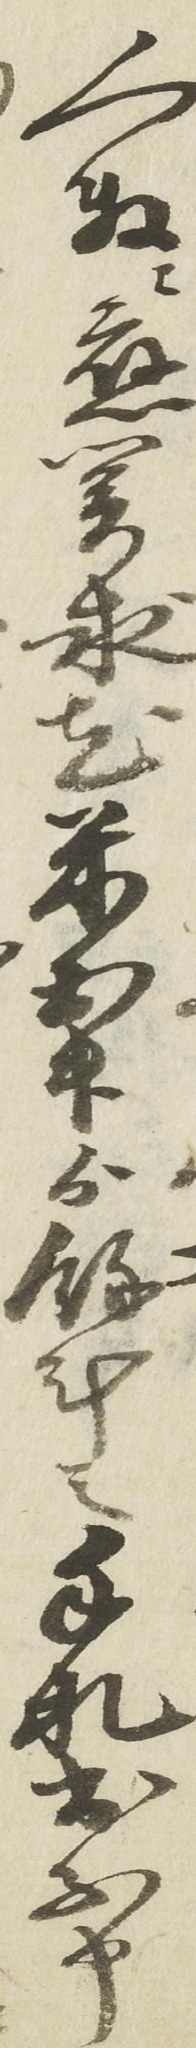人数ニ応買求尤米五升ゟ餘斗之手札出不申
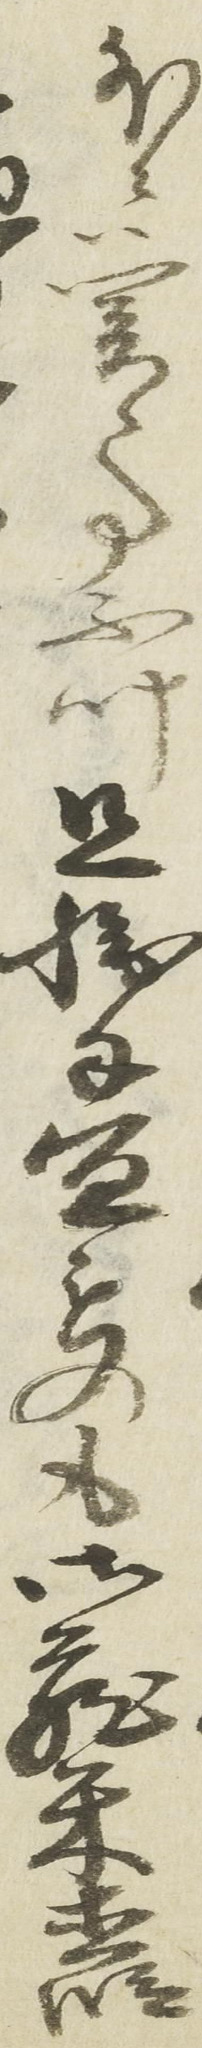外二は買事不叶且勝手宣ものも御蔵米直段
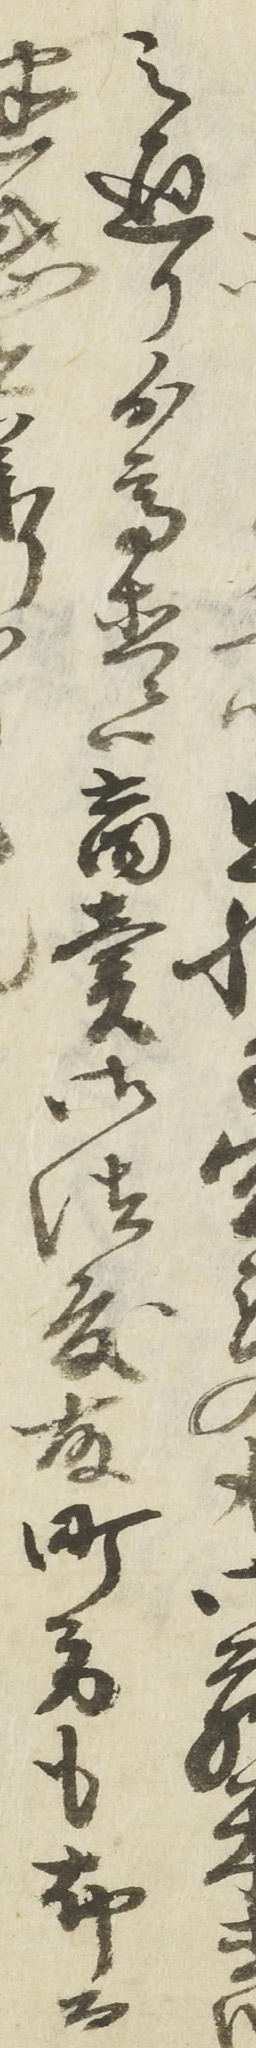の通りゟ高直ニは商売御法度故町方も却而
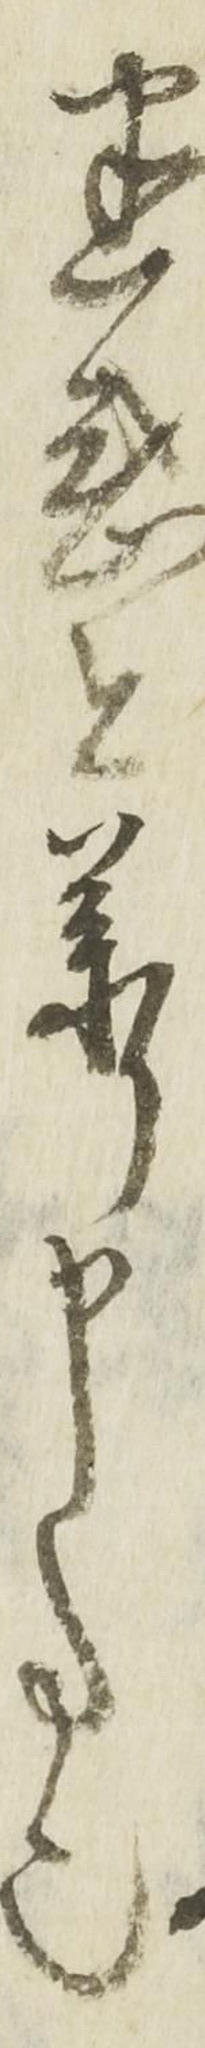迷惑と承り申事也
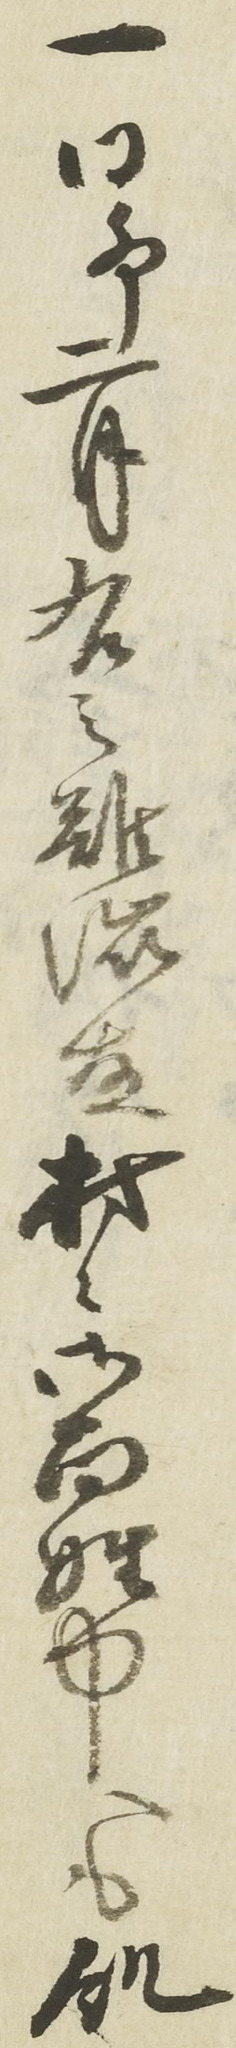一同卯二月右の難渋故村々御百姓中へも飢
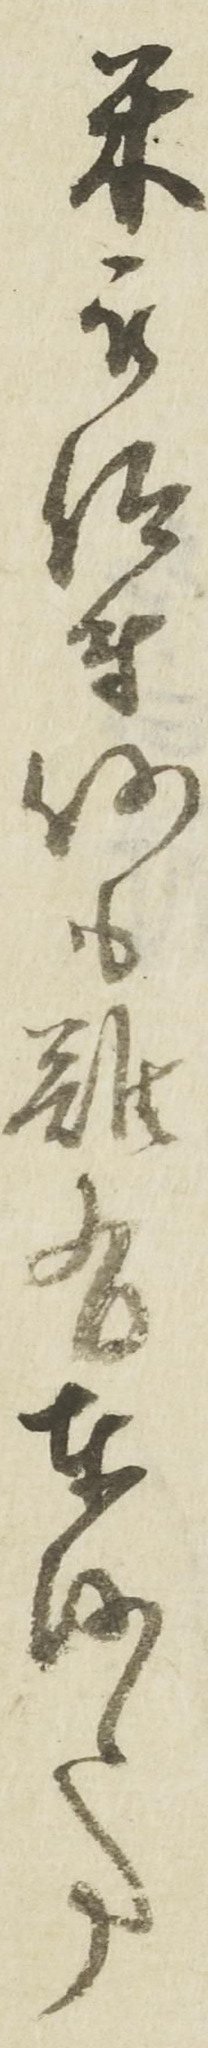米被仰付何も難有奉存候事
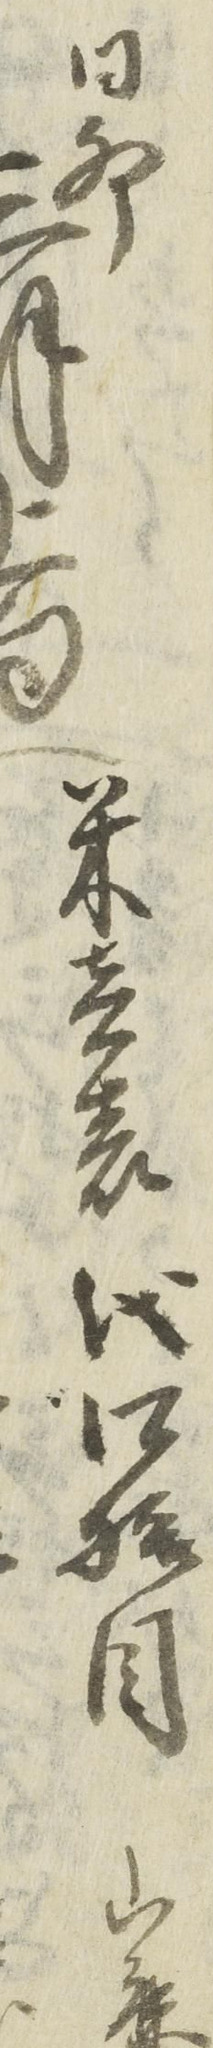同卯三月上旬米壱表代四拾目山鹿
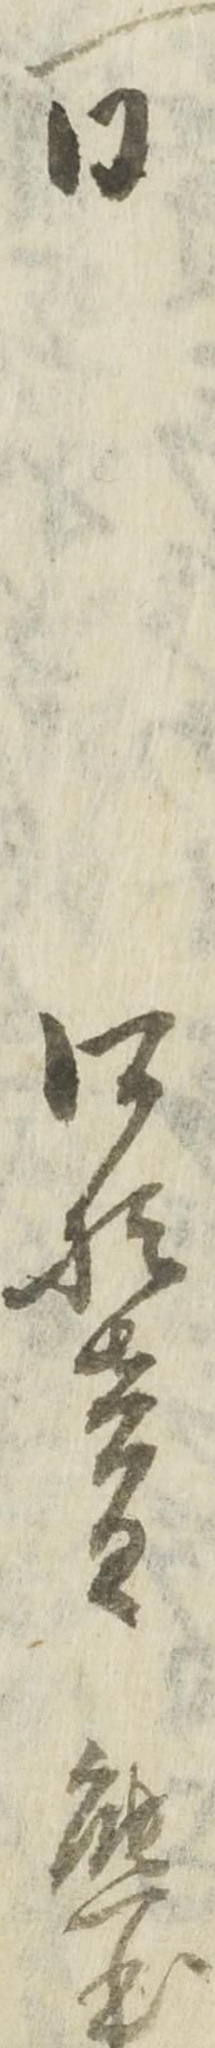同四拾壱匁熊本
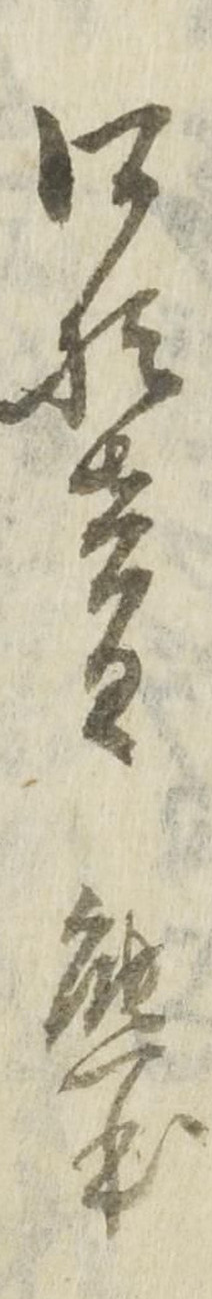同四拾壱匁熊本
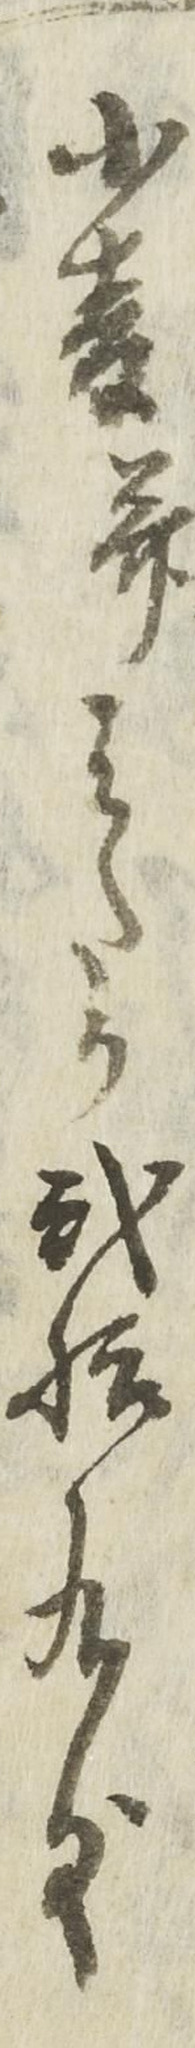小麦并はたか弐拾九匁
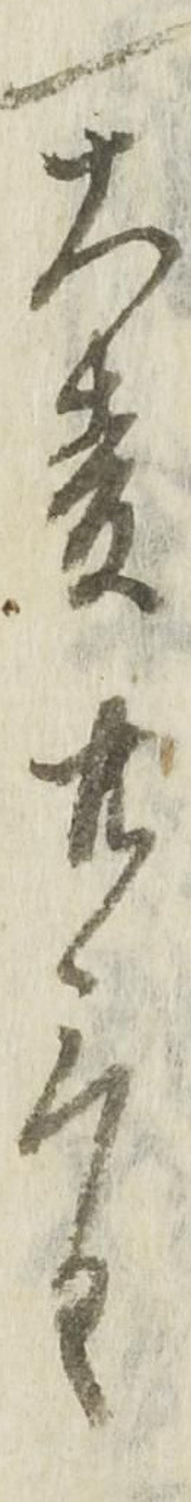大麦廿三匁
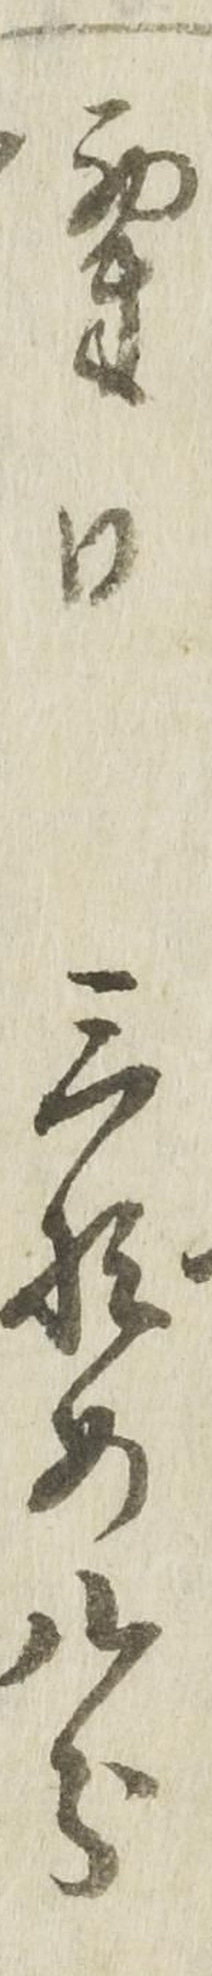粟同三拾め八分
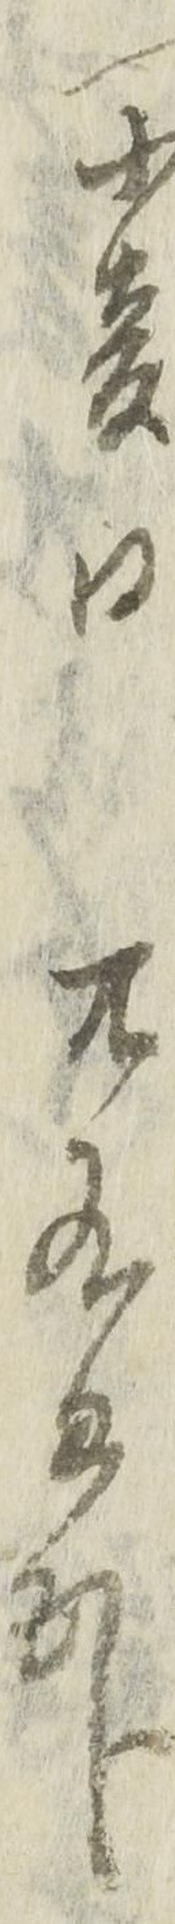小麦同廿九匁五分
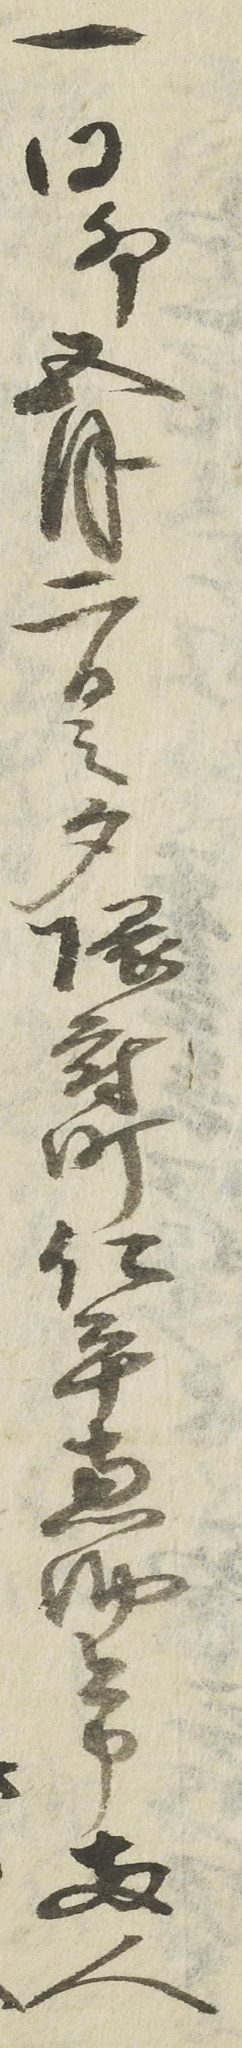一同卯五月二日の夕隈府町仁平恵助と申両人
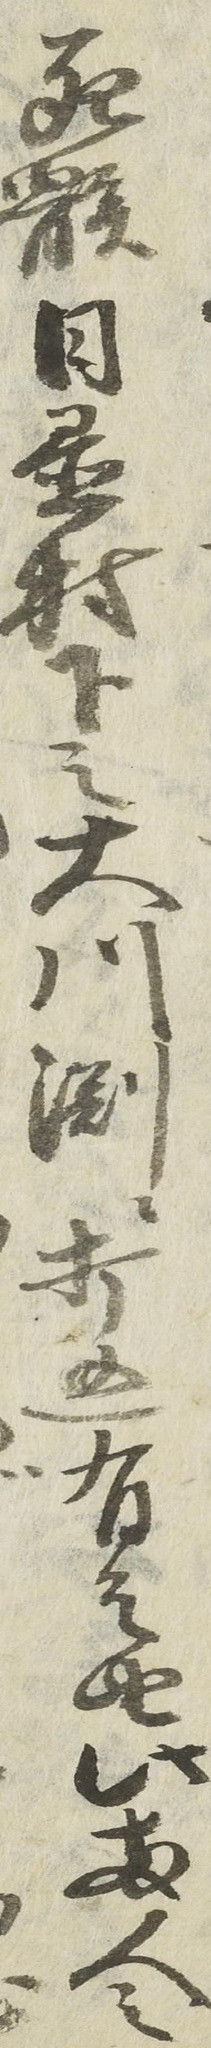死骸日置村下の大川渕ニ打込有之由此両人の
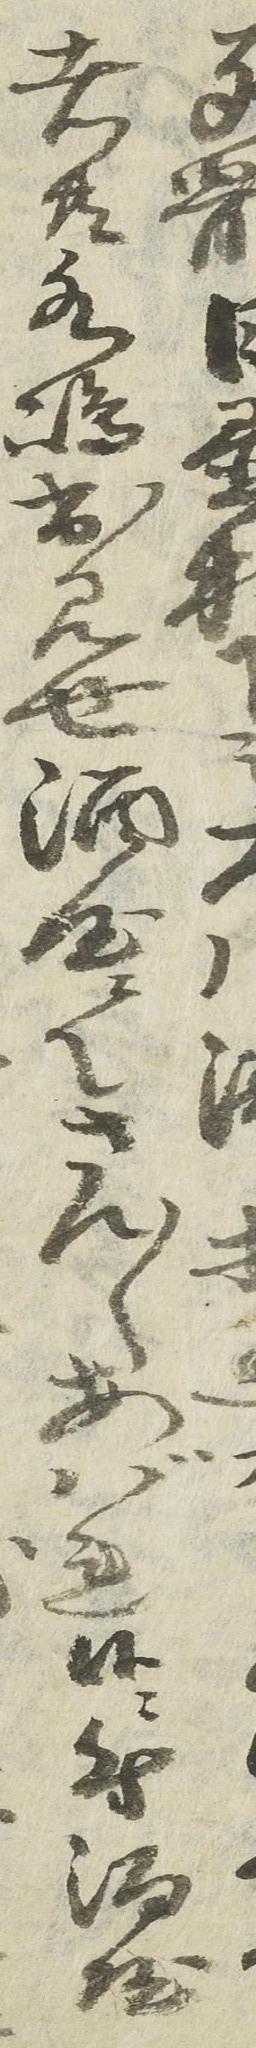者共水嶋出見せ酒屋ニてさん〳〵あばれ候ニ付酒屋
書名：後見笑
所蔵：東京大学地震研究所図書室 Earthquake Research Institute Library, The University of Tokyo, JAPAN
